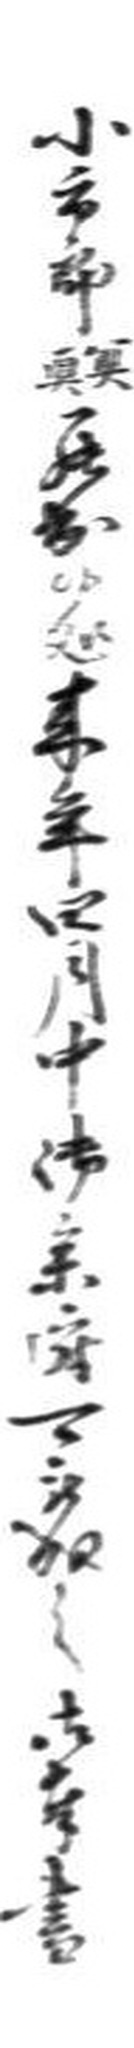小市郎冥真罷出候処来年四月中御参府可被成之御奉書
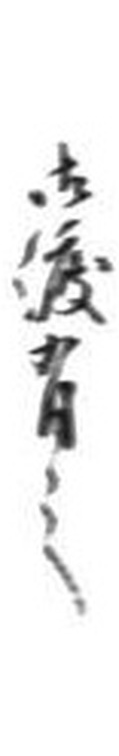御渡有之

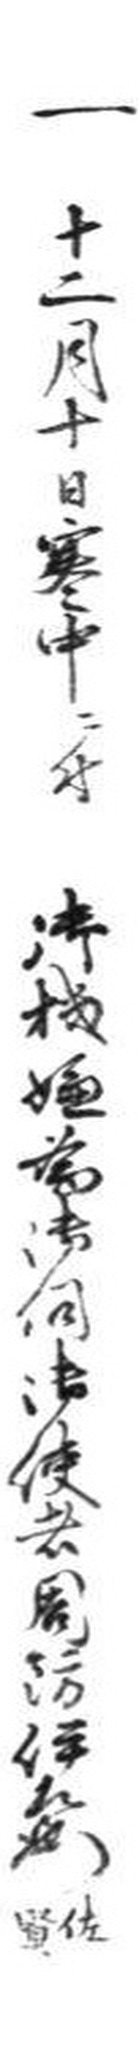一、十二月十日寒中ニ付御機嫌為御伺御使者周防伊左衛門佐賢
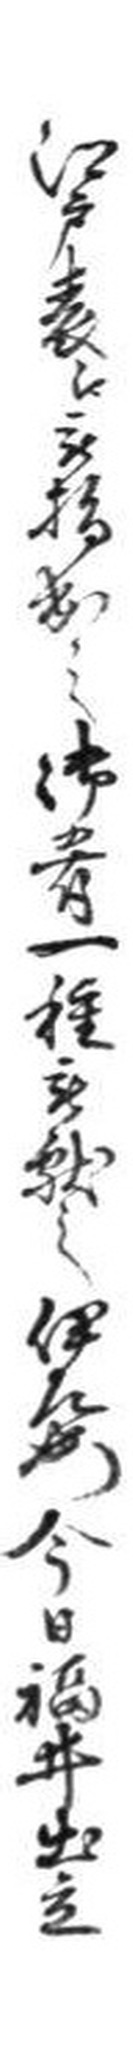江戸表江被指出之御肴一種被献之伊左衛門今日福井出立
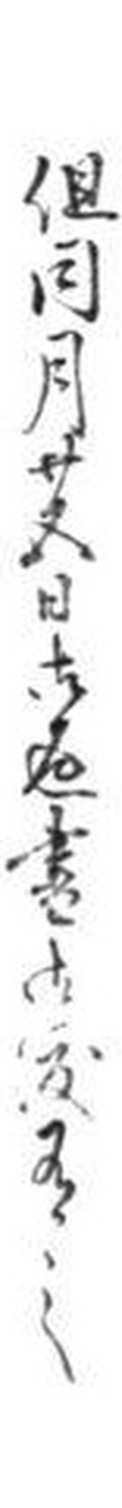但同月廿五日御返書御渡有之
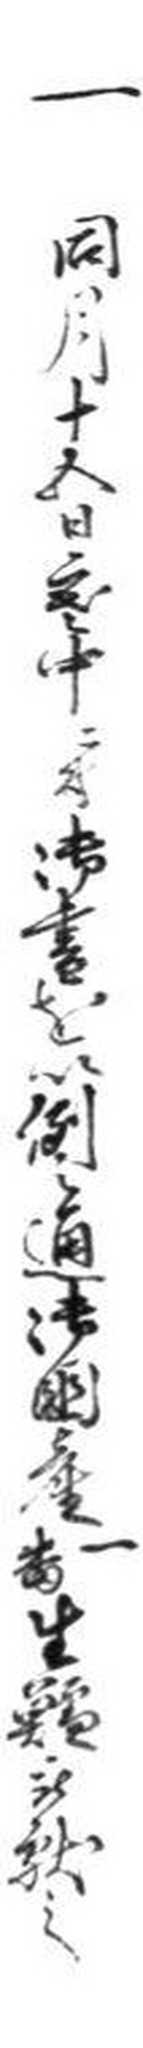一、同月十五日寒中ニ付御書を以例之通御国産一番生鱈被献之
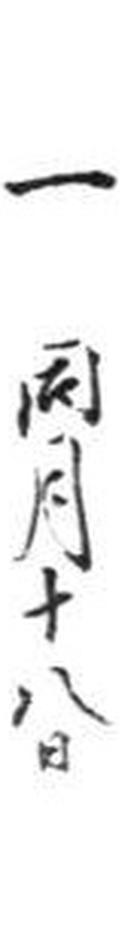一、同月十八日
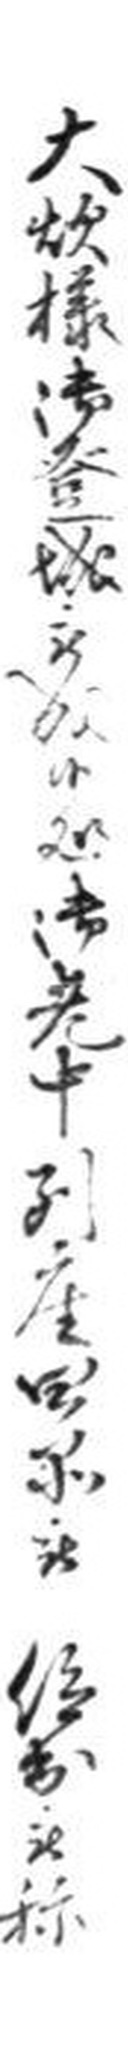大炊様御登城被成候処御老中列座四品被仰出被称
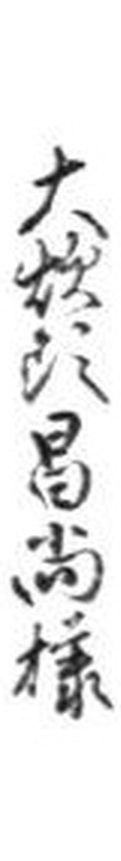大炊頭昌尚様
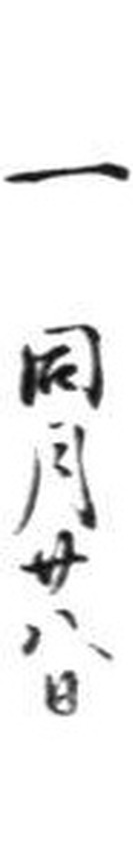一、同月廿八日
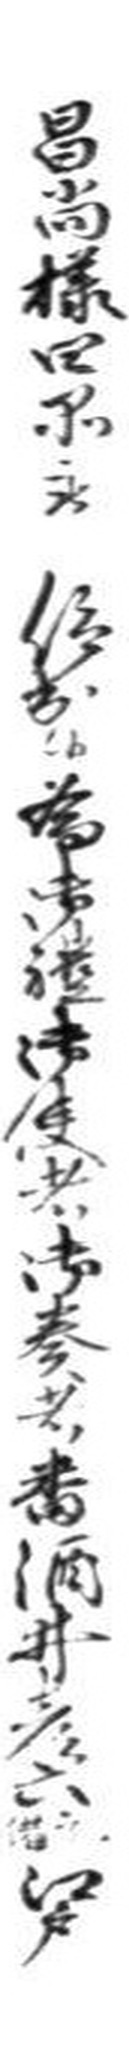昌尚様四品被仰出候為御礼御使者御奏者番酒井彦六元脩江戸
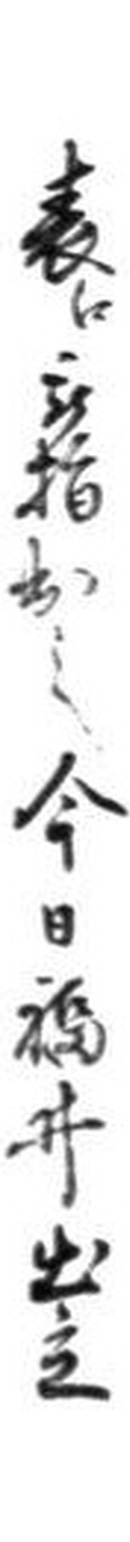表江被指出之今日福井出立
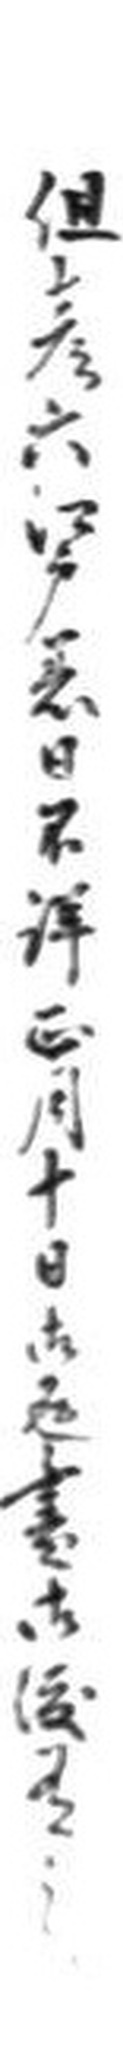但彦六江戸着日不詳正月十日御返書御渡有之
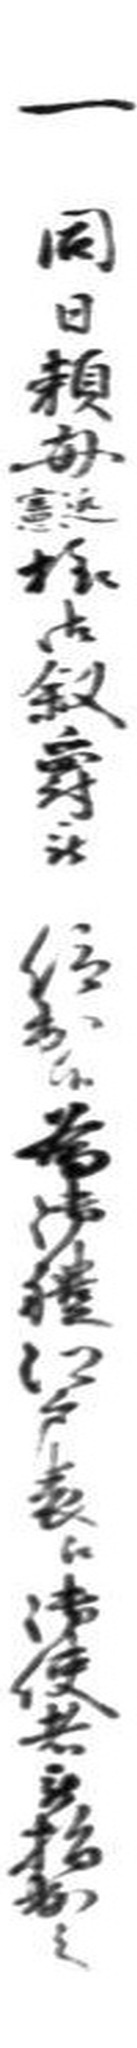一、同日頼母近憲様御叙爵被仰出候為御礼江戸表江御使者被指出之
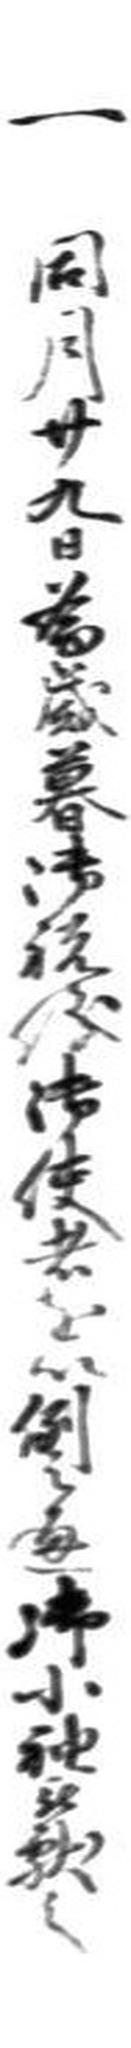一、同月廿九日為歳暮御祝儀御使者を以例之通御小袖被献之
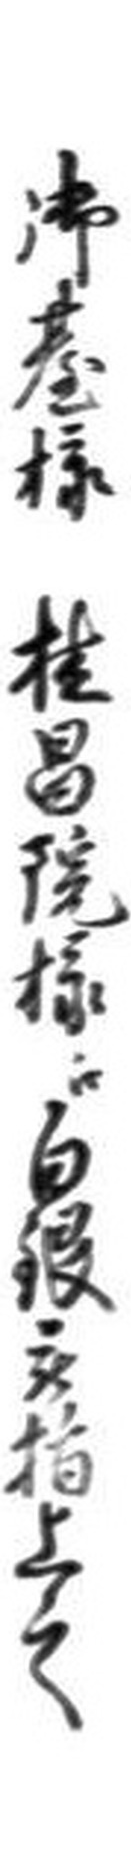御台様桂昌院様江白銀被指上之
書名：家譜 二十一 吉品公 従元禄十三年到同十四年
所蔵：福井県文書館 Fukui Prefectural Archives
